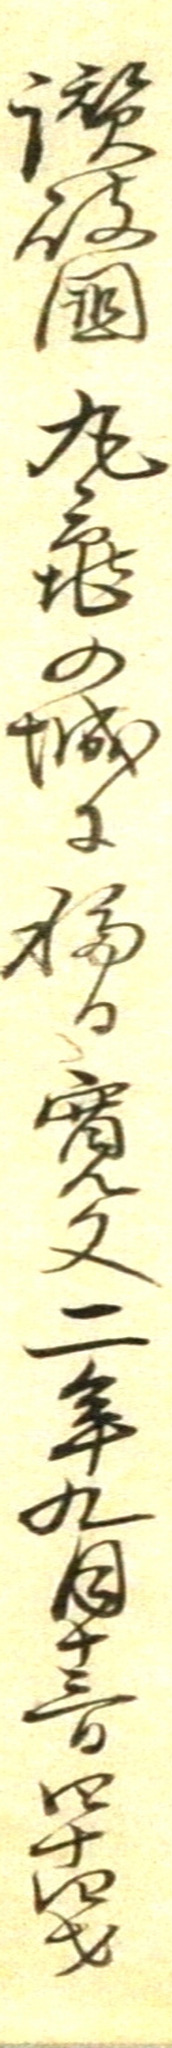讃岐国丸亀の城に移る寛文二年九月十三日四十四才
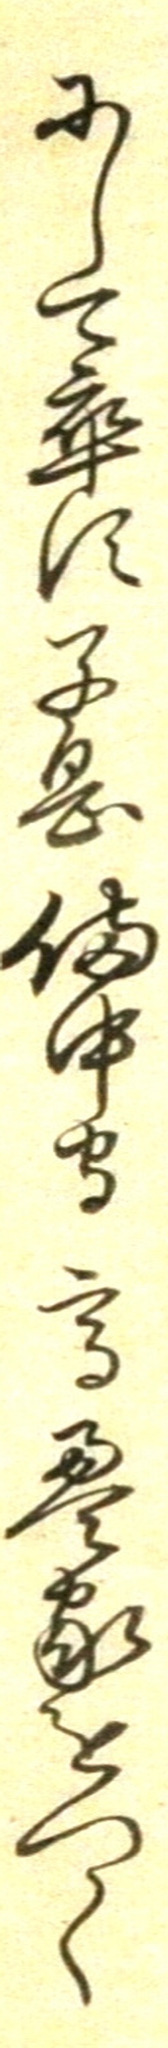にして卒す子息備中守貴豊家をつく
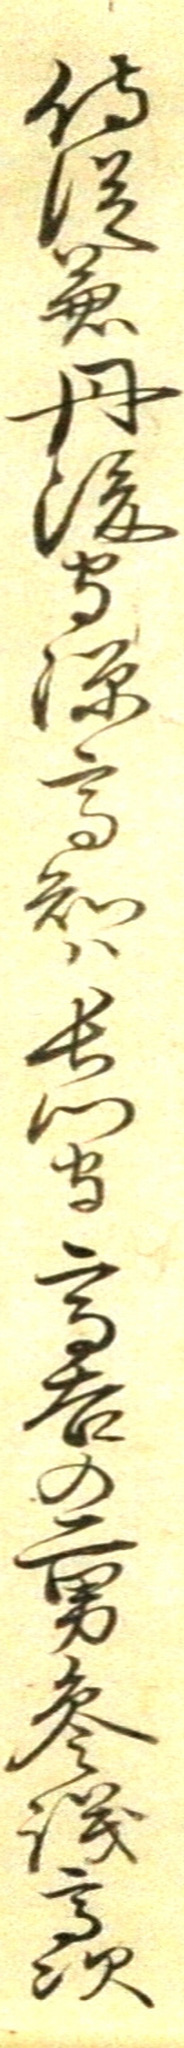侍従兼丹後守源高知は長門守高吉の二男参議高次
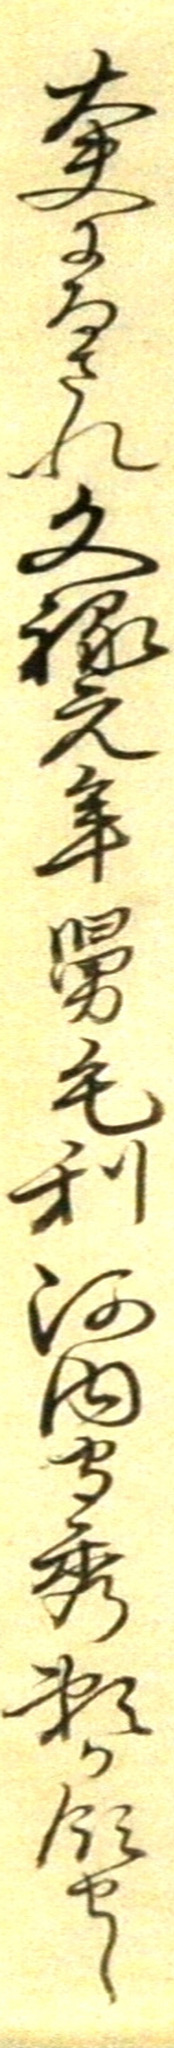大夫になされ文禄元年舅毛利河内守秀頼か領せし

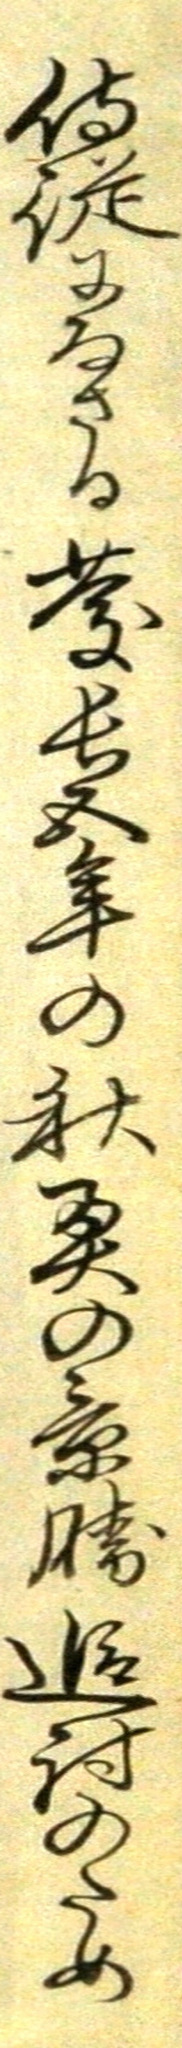侍従になさる慶長五年の秋奥の景勝追討のため
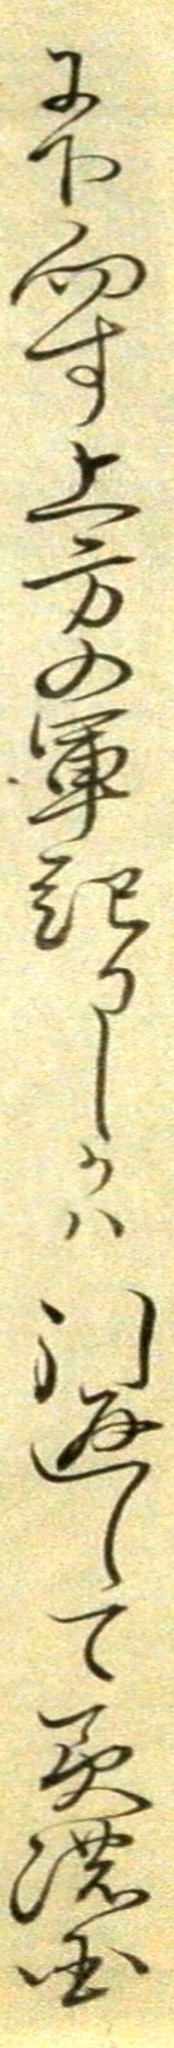に下向す上方の軍起りしかは引返して美濃国
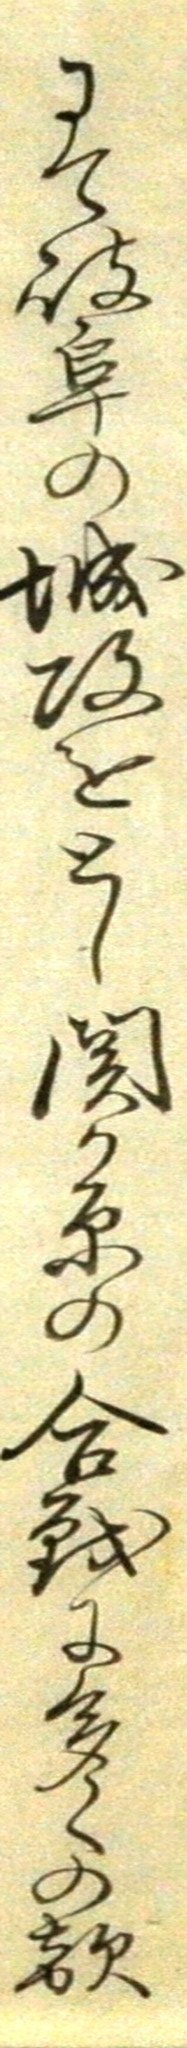にて岐阜の城攻をとし関か原の合戦に多くの敵
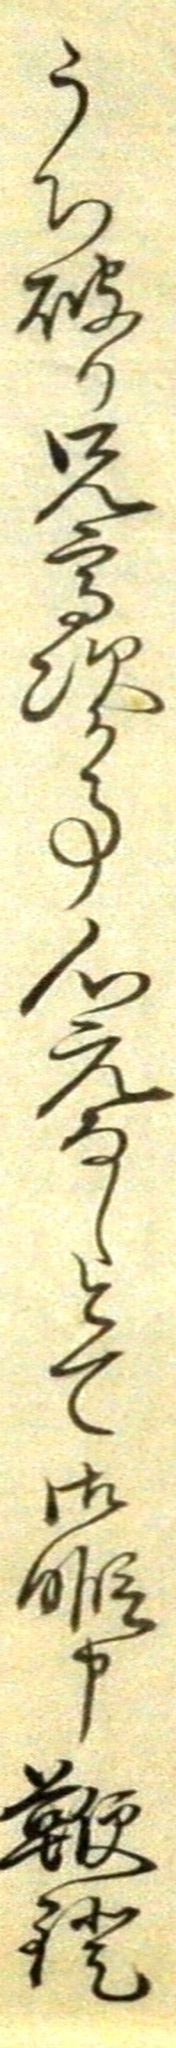うち破り兄高次か事心元なしとて御暇申鞭鐙
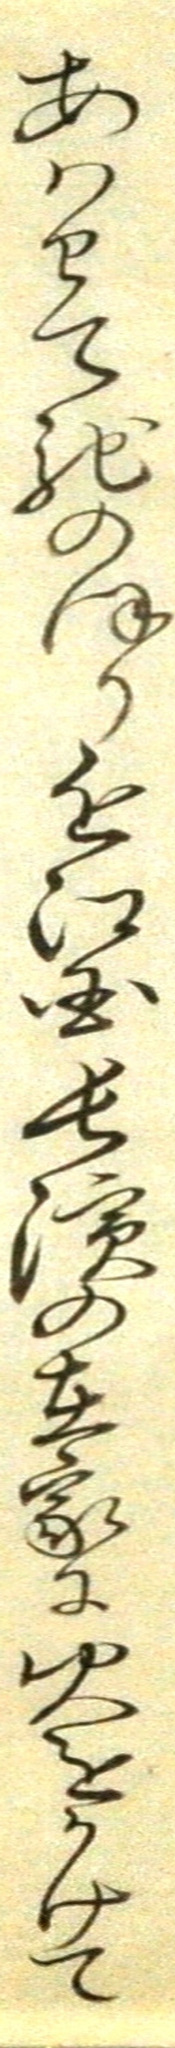あはせて馳のほり近江国長浜の在家に火をかけて
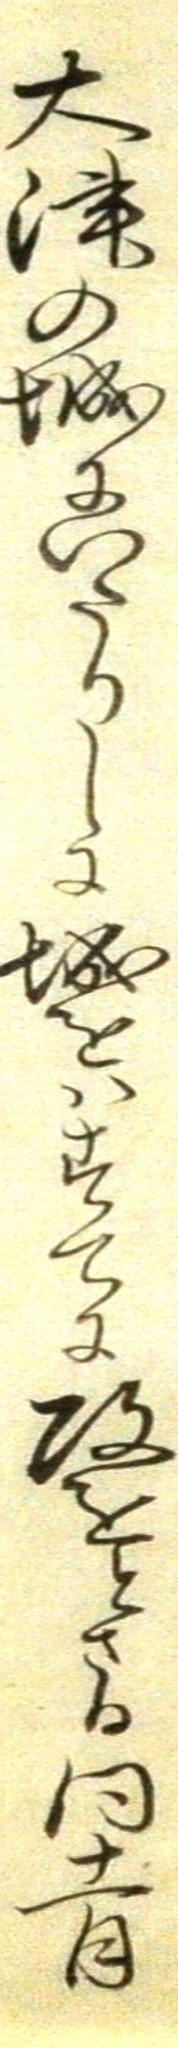大津の城にいたりしに城をはすてに攻をとさる同十一月
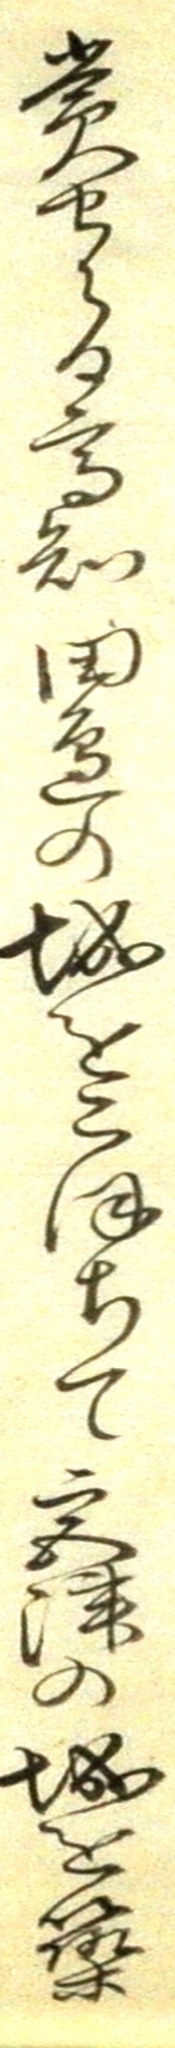賞せらる高知田辺の城をこほちて宮津の城を築
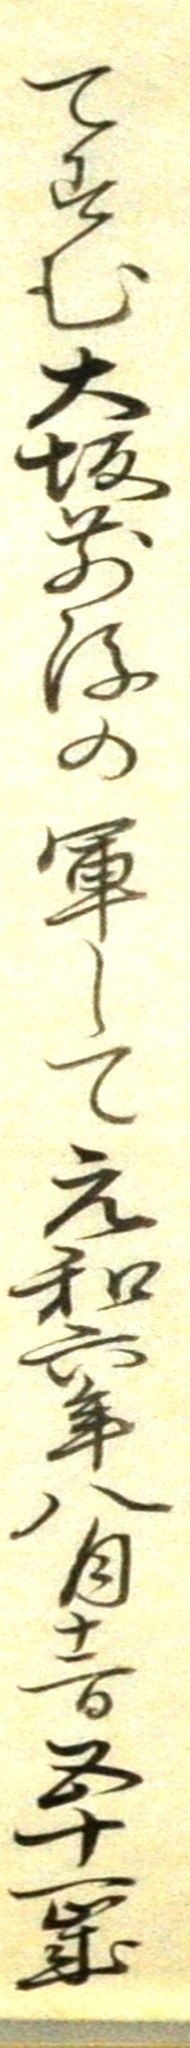てすむ大坂前後の軍して元和六年八月十二日五十一歳
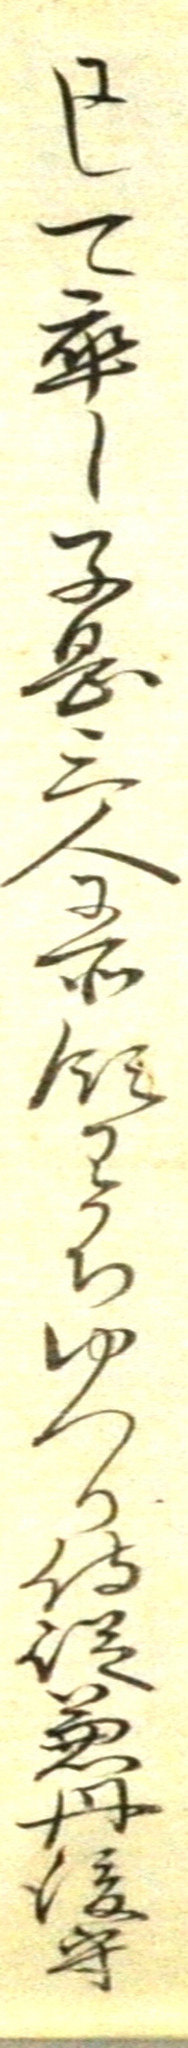にして卒し子息三人に所領わかちゆつる侍従兼丹後守
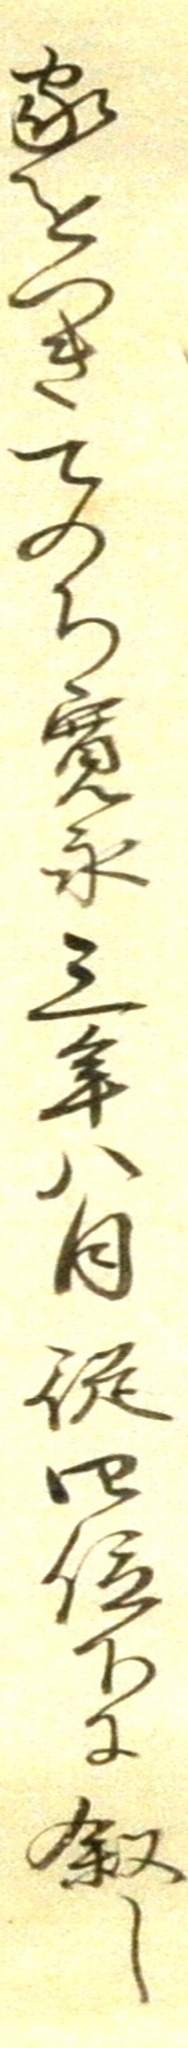家をつきてのち寛永三年八月従四位下に叙し
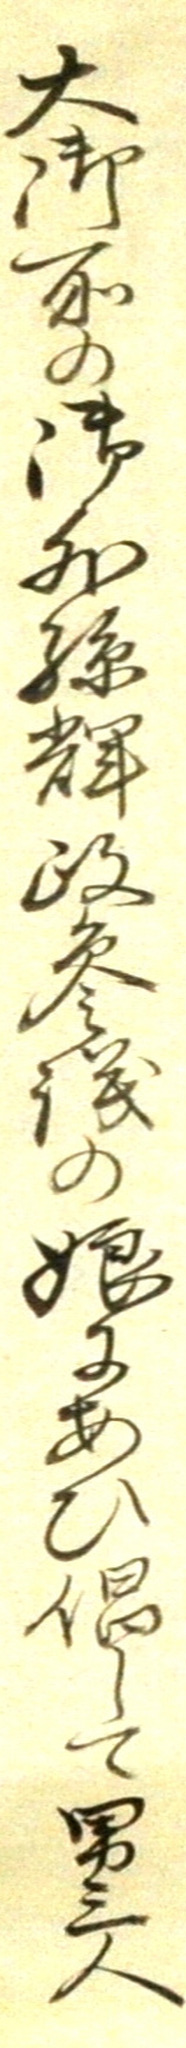大御所の御外孫輝政参議の娘にあひ倡して男三人
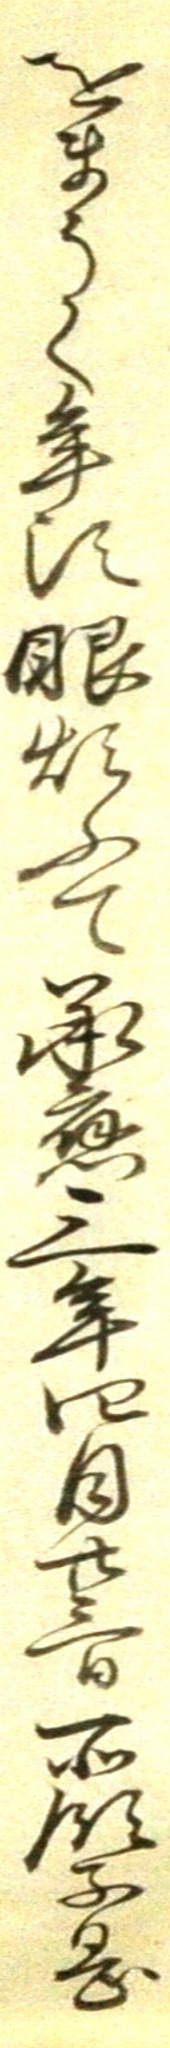をまうく年頃眼煩ふて承応三年四月廿三日所領子息
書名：藩翰譜（七・上）
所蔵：伊那市立高遠町図書館・合同会社AMANE
